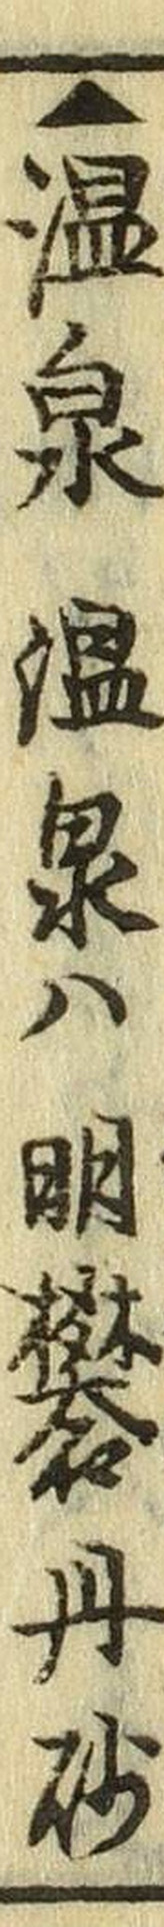▲温泉温泉は明礬丹砂
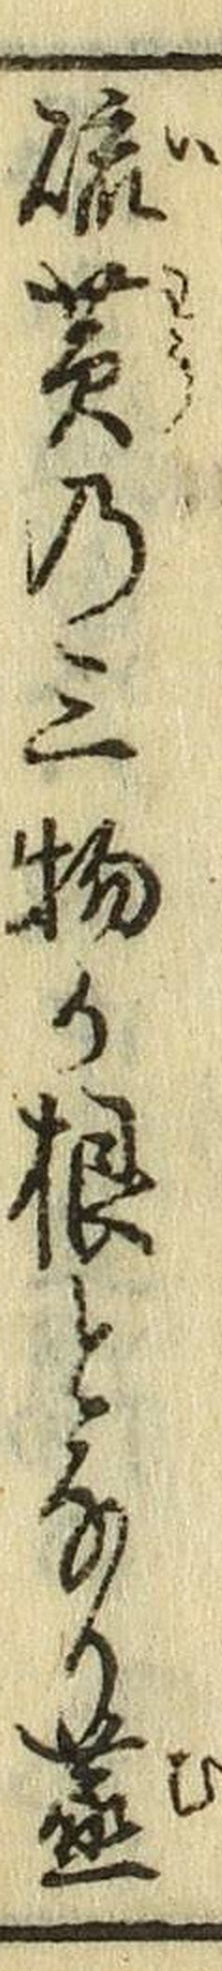硫黄の三物か根となり烝
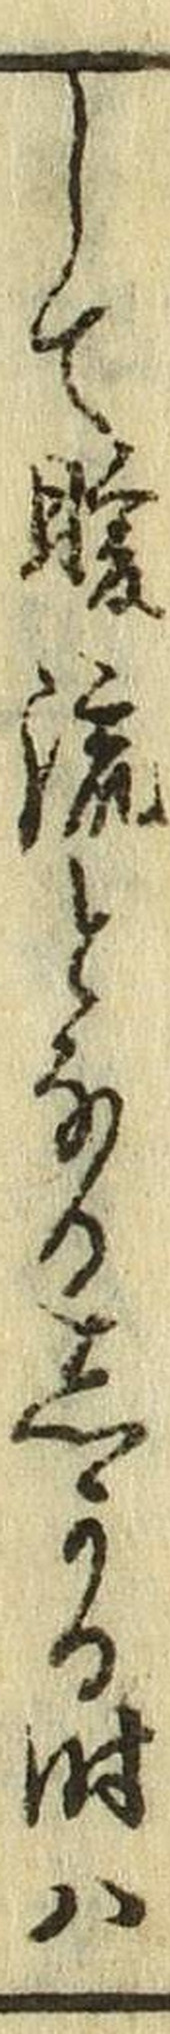して暖流となるしかる時は
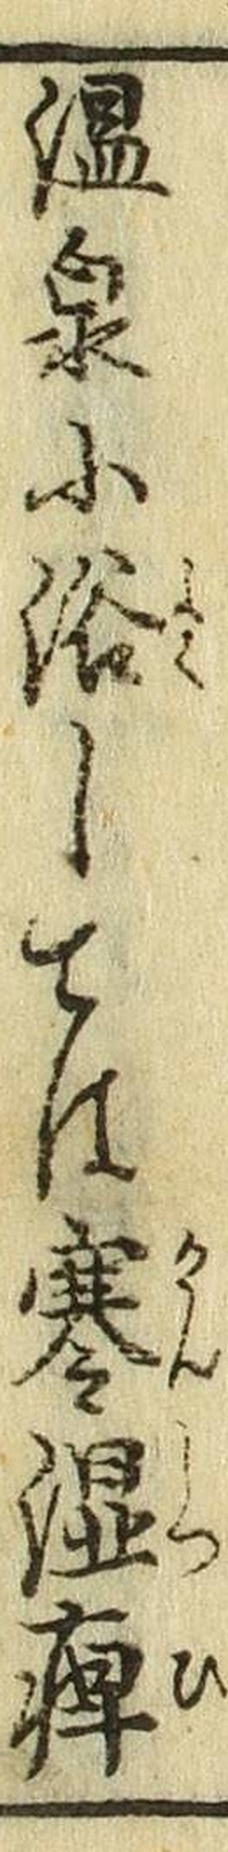温泉に浴しては寒湿痺
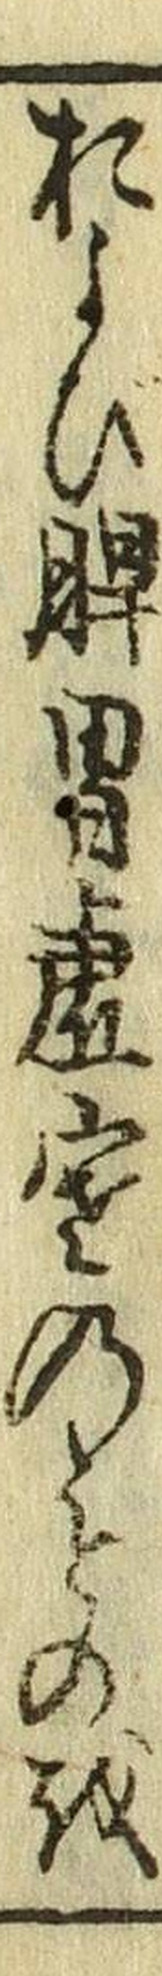および脾胃虚寒のものを
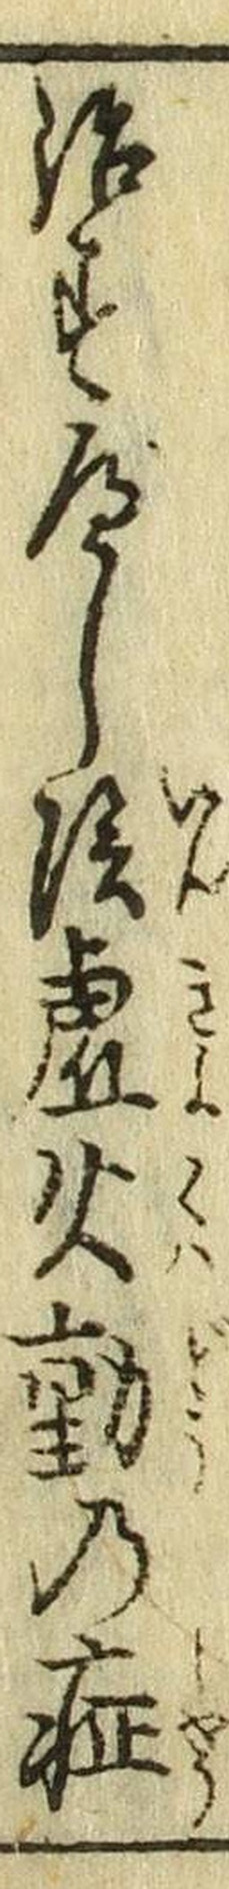治すへし陰虚火動の症

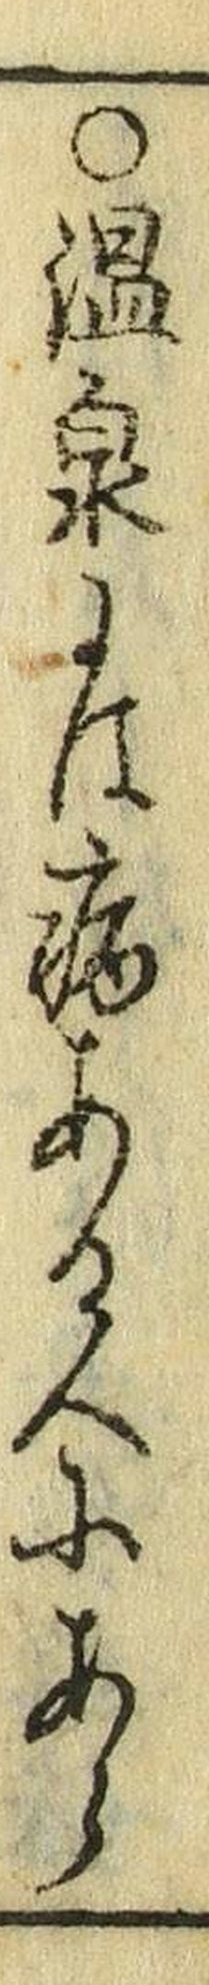○温泉には病ある人にあら
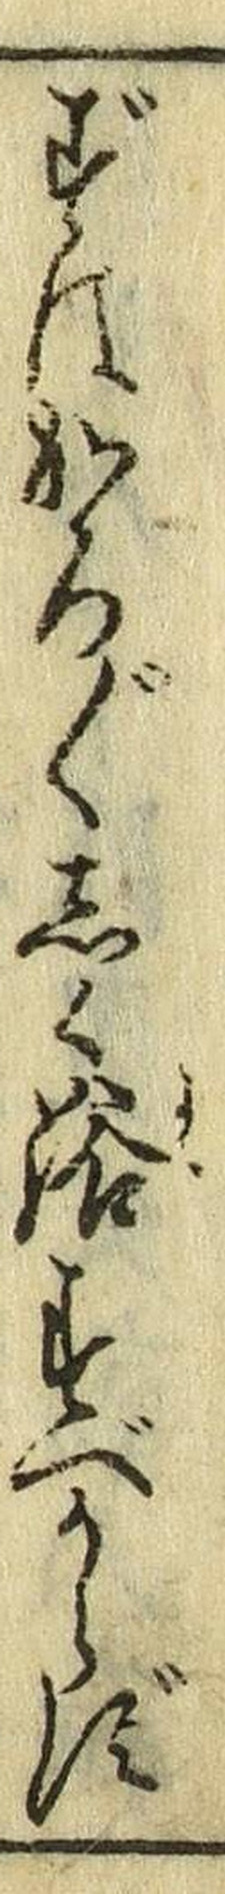ずはかろ〴〵しく浴すべからず
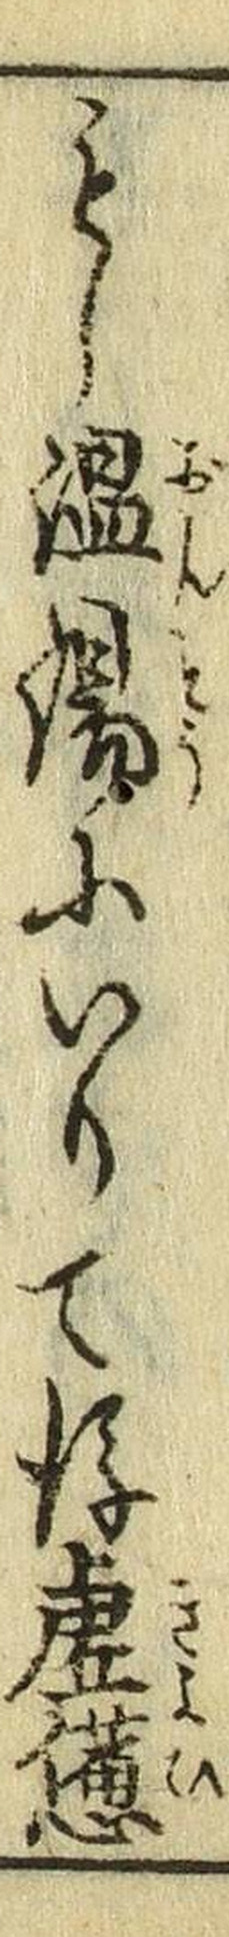もし温湯にいりて後虚憊
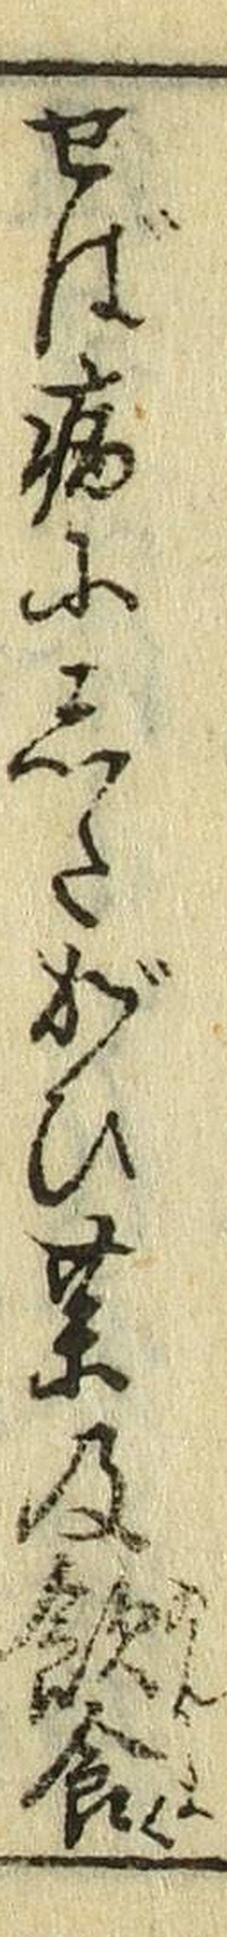せば病にしたがひ薬及飲食
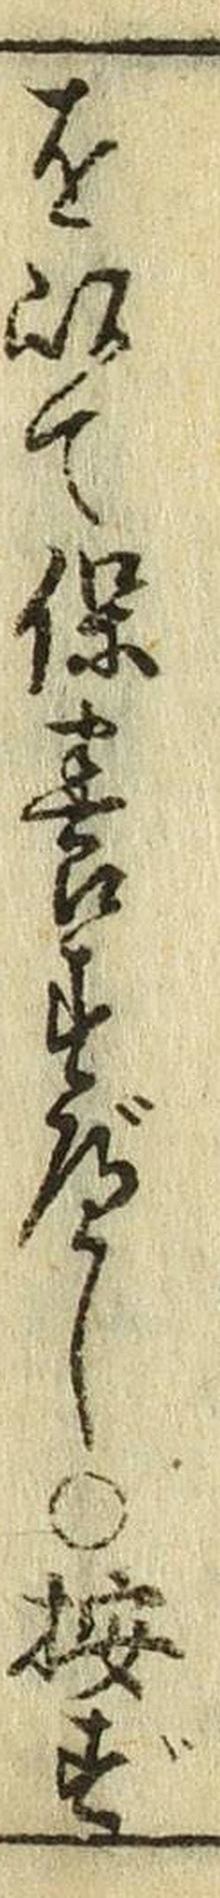を以て保養すべし○按ず
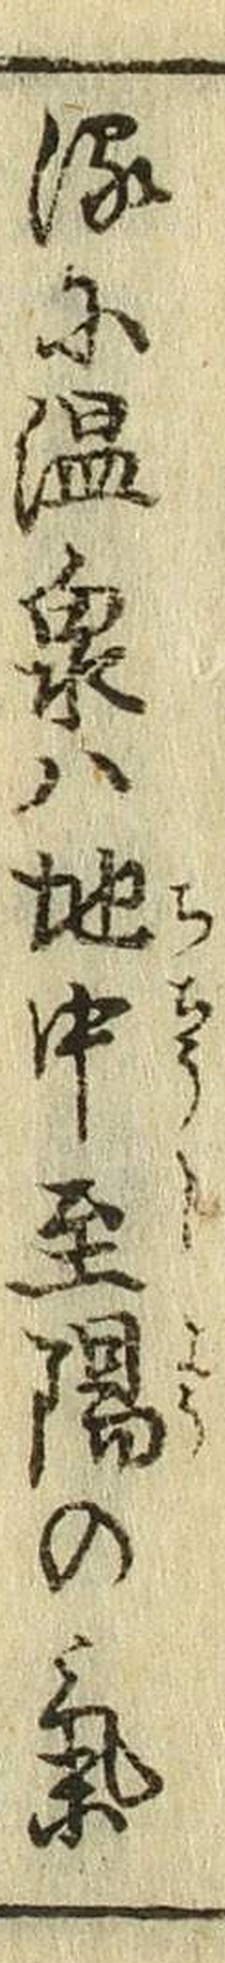るに温泉は地中至陽の気
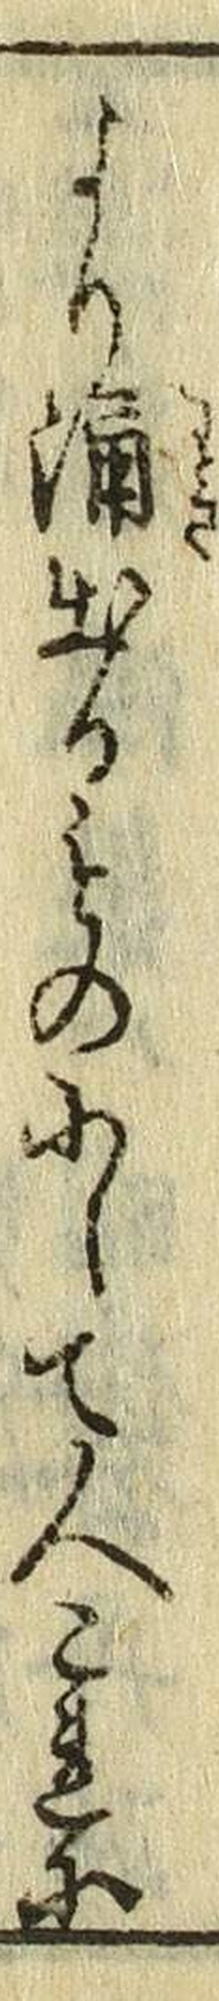より湧出るものにして人これに
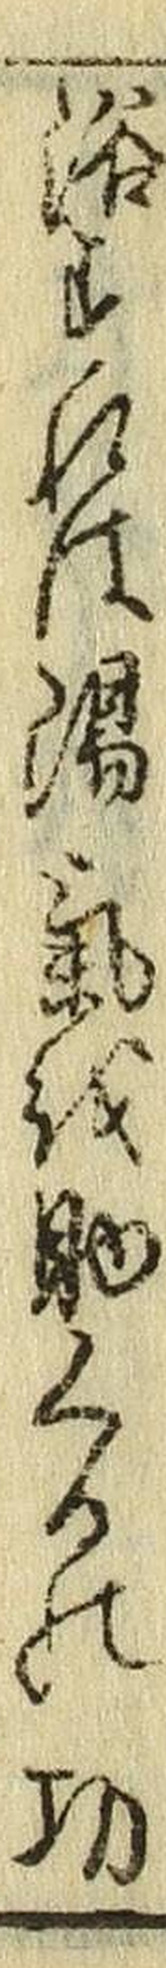浴すれは湯気を助くるの功
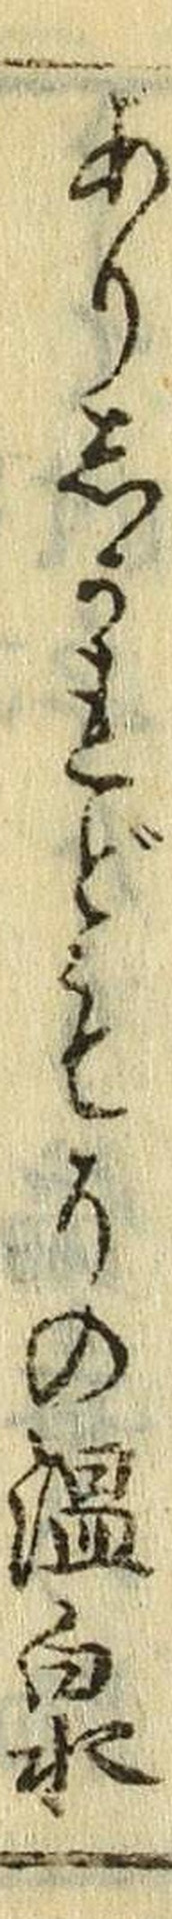ありしかれどもその温泉
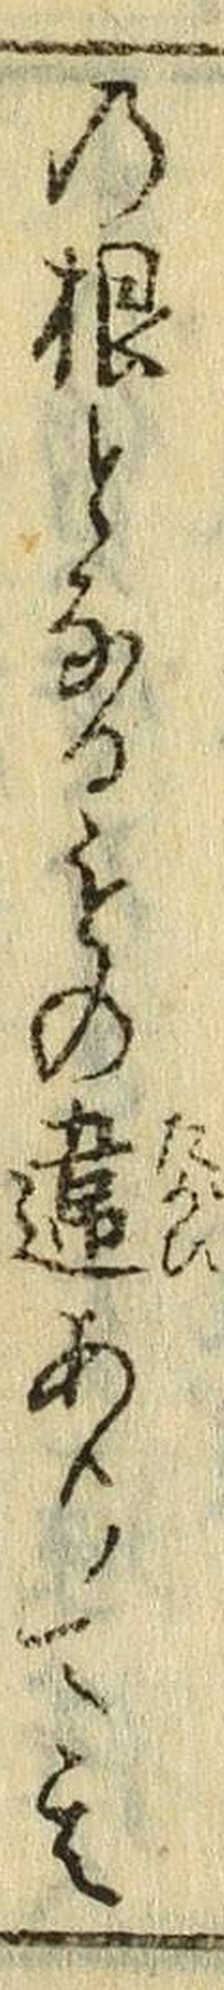の根となるもの違ありて其
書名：居家養生記
